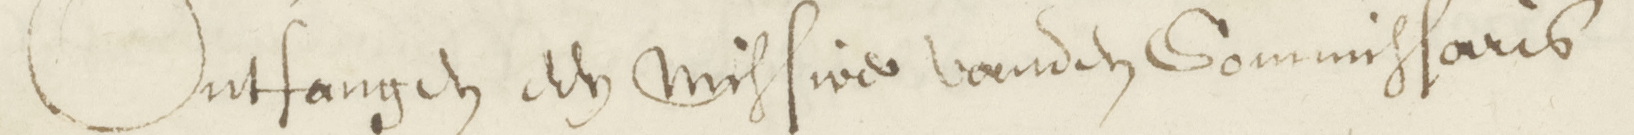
Ontfangen een Missive vanden Commissaris
